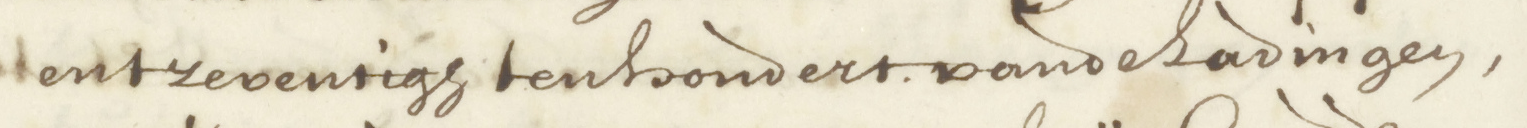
sentzeventigh ten hondert vande ladingen,
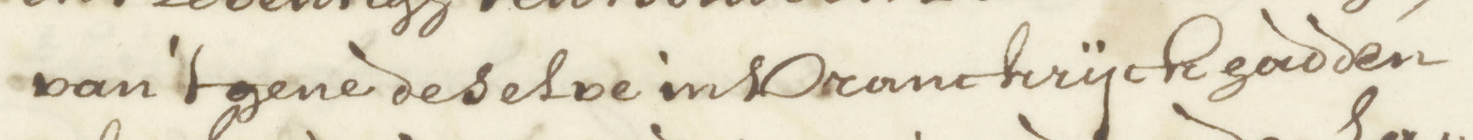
van 't gene deselve in Vranckrijck hadden
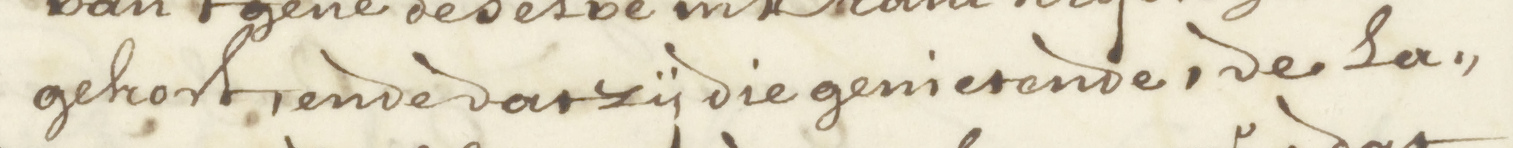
gekost, ende dat zij die genietende, de la„
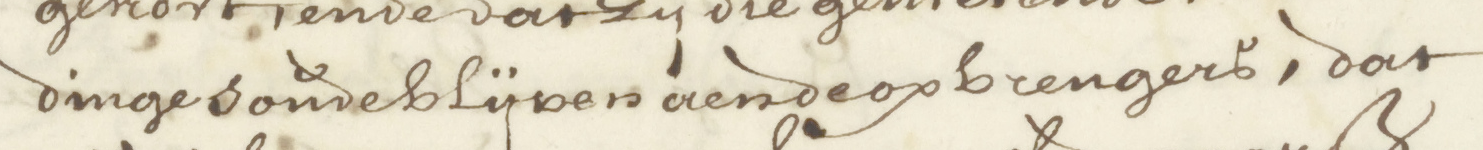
dinge soude blijven aende opbrengers, dat
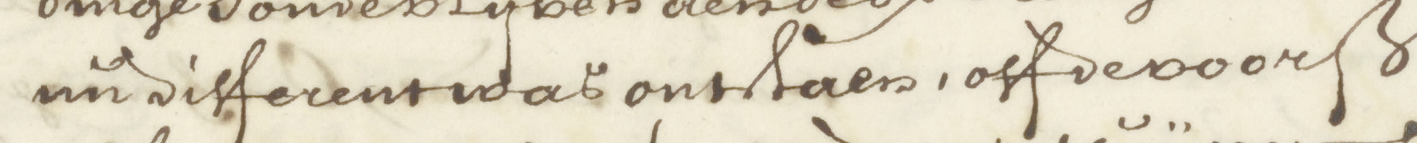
nu different was ontstaen, off de voors
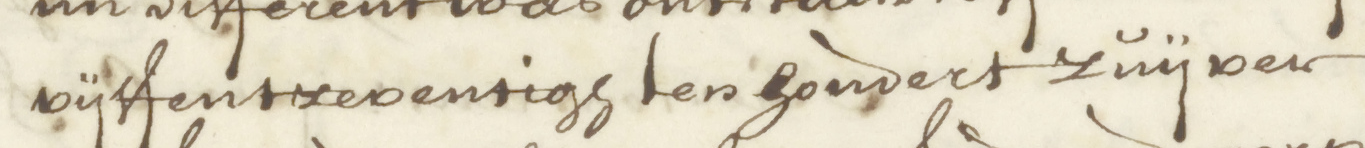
vijffentreventigh ten hondert zuijver
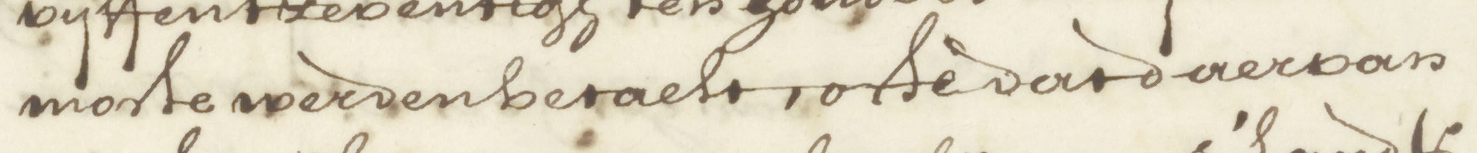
moste werden betaelt, ofte dat daervan
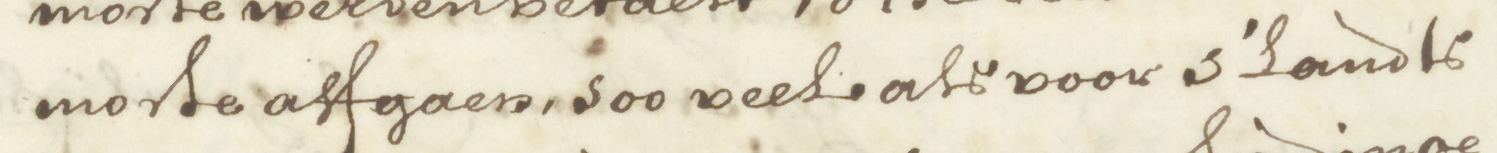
moste affgaen, soo veel als voor s'Landts
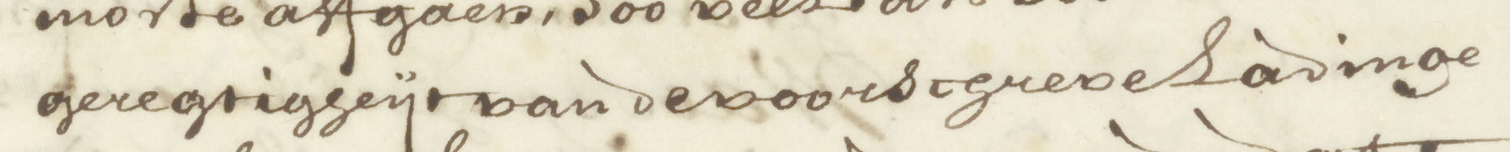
geregtigheijt van de voorschreve Ladinge
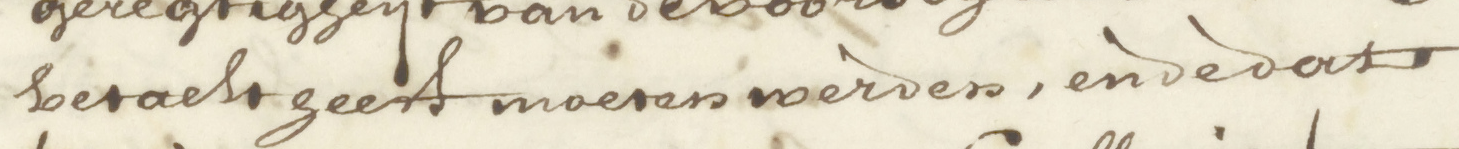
betaelt heeft moeten werden, ende dat
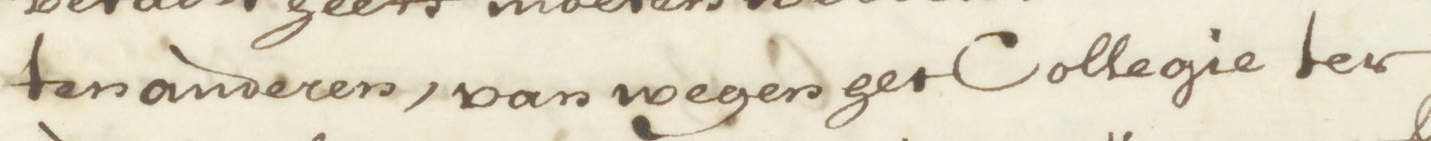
ten anderen, van wegen het Collegie ter
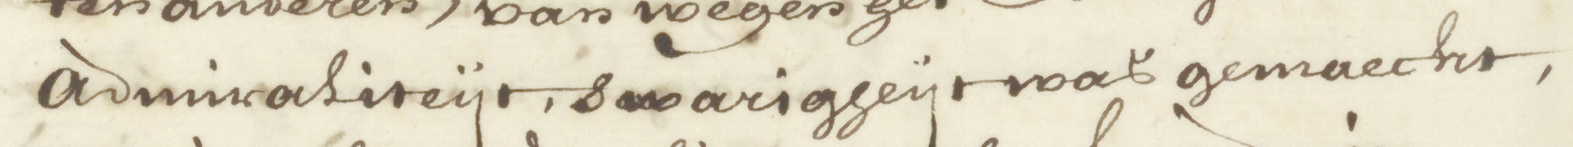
Admiraliteijt, swarigheijt was gemaeckt,
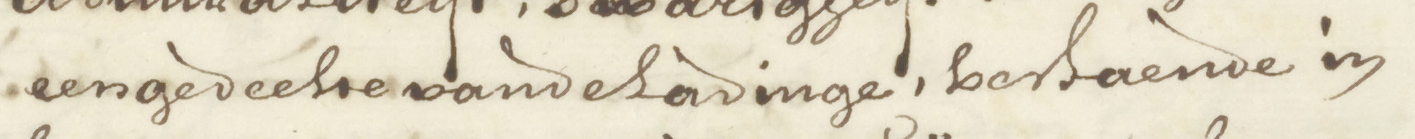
een gedeelte vande ladinge, bestaende in
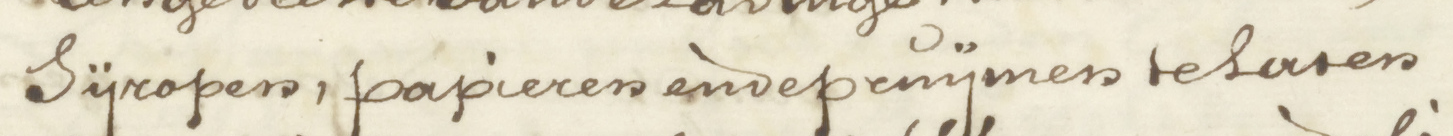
Sijropen, papieren ende pruijmen te laten
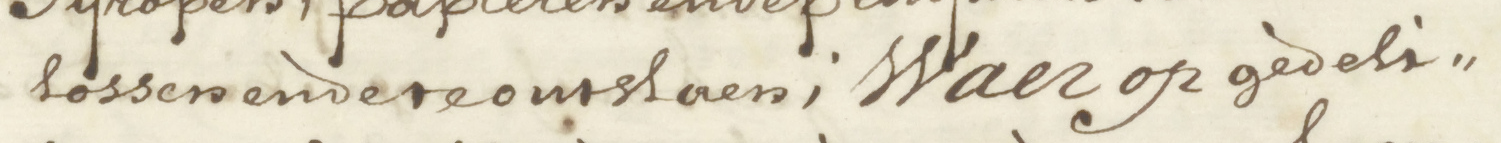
lossen ende te ontslaen; Waer op gedeli„
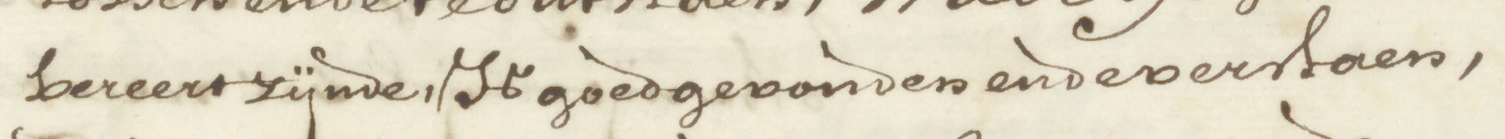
bereert zijnde, Is goedgevonden ende verstaen,
